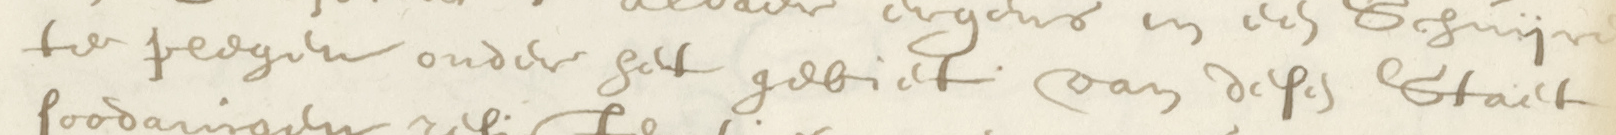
te plegen onder het gebiet van desen Staet
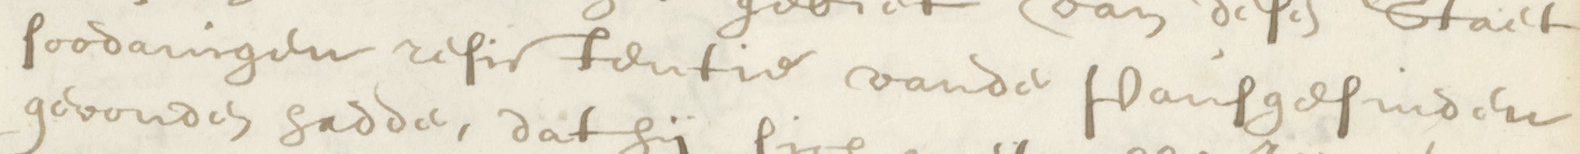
soodanigen resistentie vande Pausgesinden
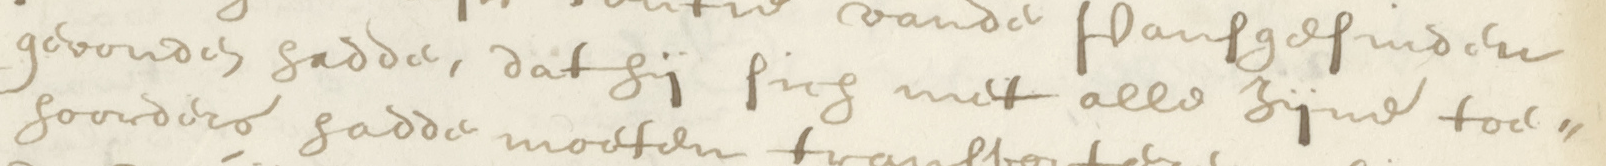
gevonden hadde, dat sij sich met alle zijne toe„
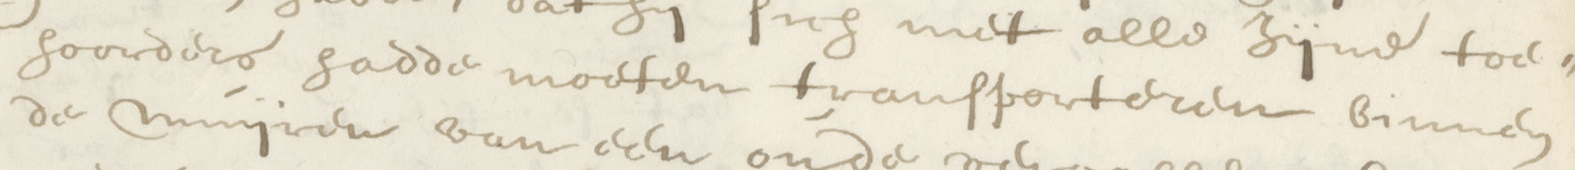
hoorders hadde moeten transporteren binnen
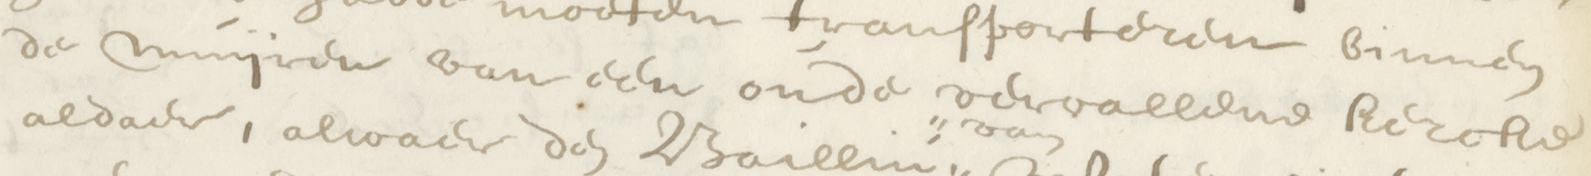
de muijren van een oude vervallene kercke
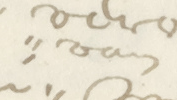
,, van
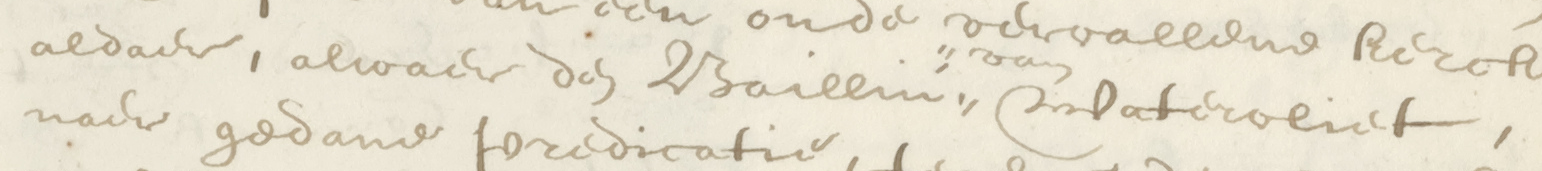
aldaer, alwaer den Bailliu,, Watervliet,
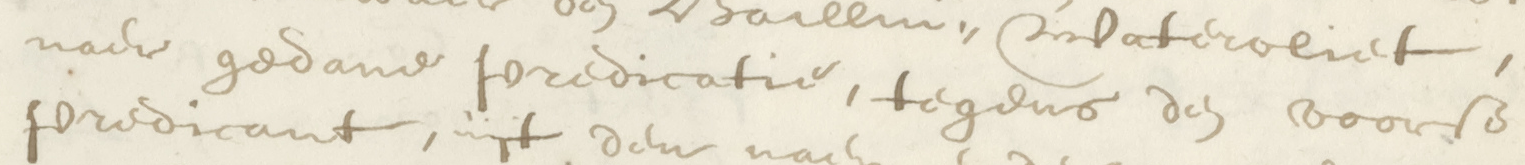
naer gedane predicatie, tegens den voors
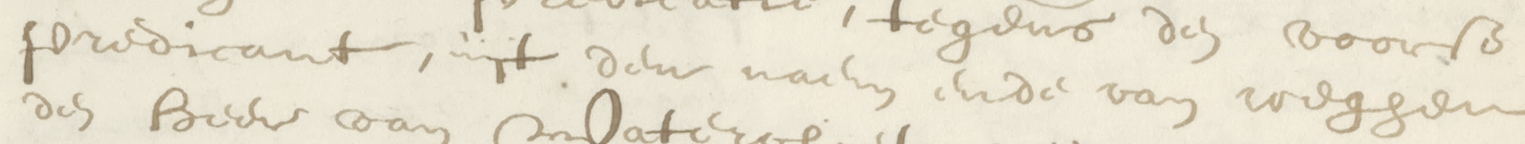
predicant, uijt den naem ende van weghen
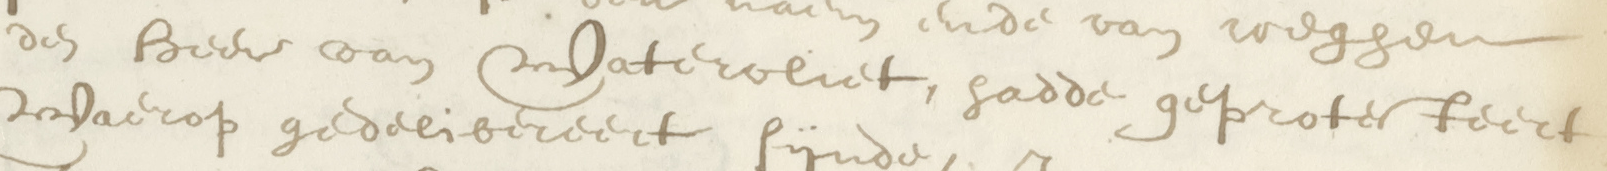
den heer van Watervliet, hadde geprotesteert.
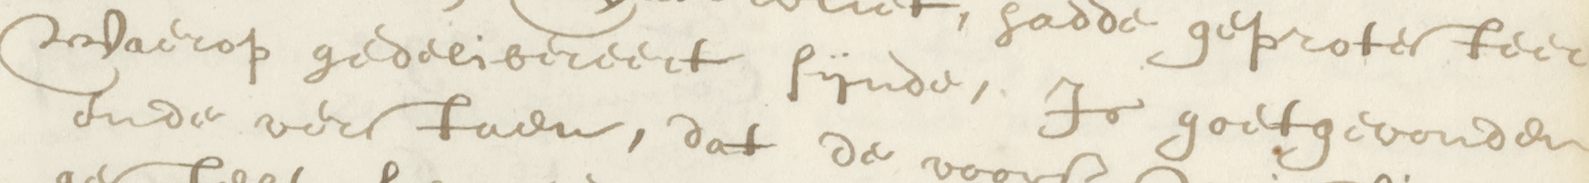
Waerop gedelibereert sijnde, Is goetgevonden
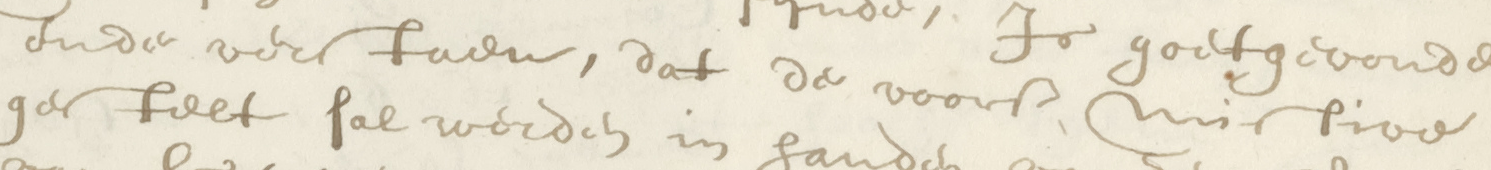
ende verstaen, dat de voors missive
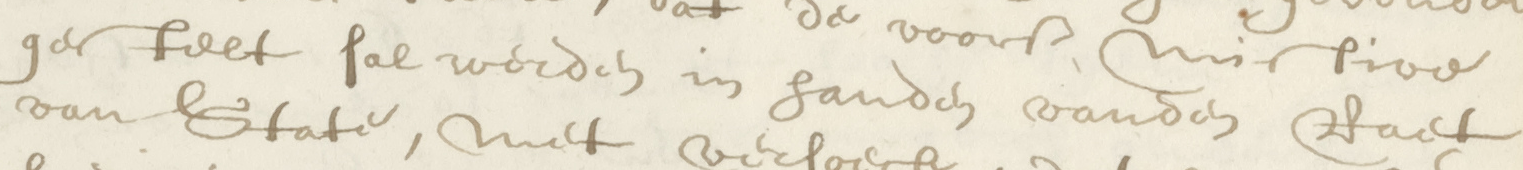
gestelt sal worden in handen vanden Raet
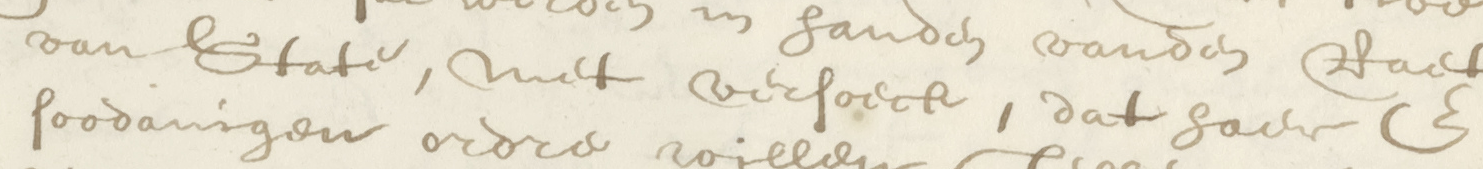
van State, met versoeck, dat haer E
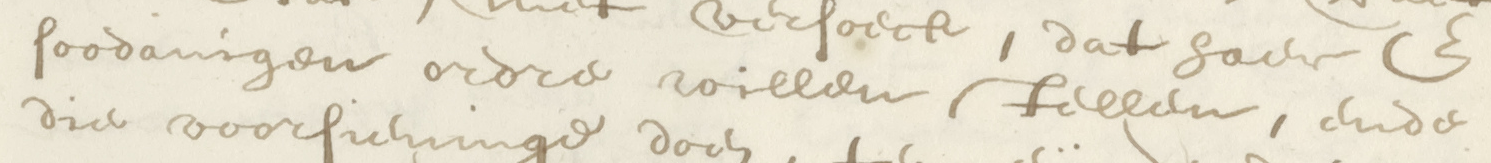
soodanigen ordre willen stellen, ende
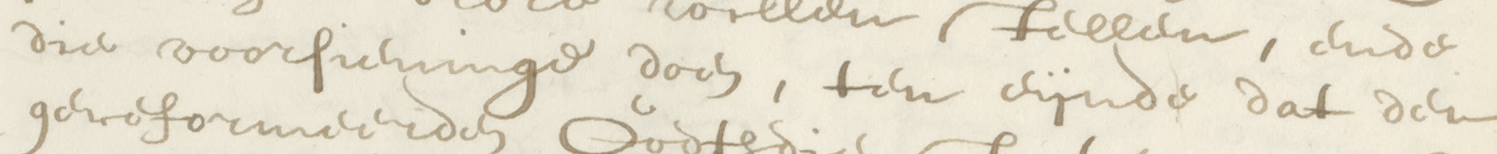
die voorsieninge doen, ten eijnde dat den
